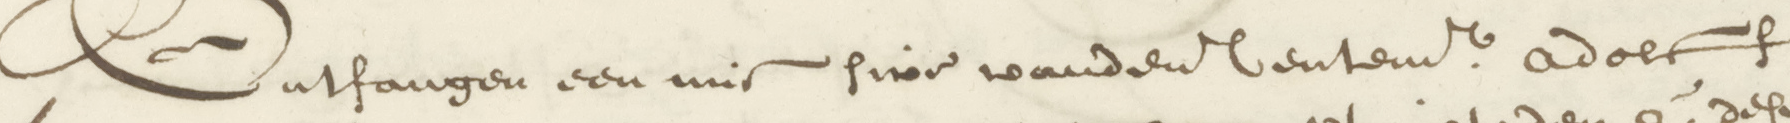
Ontfangen een missive vanden Rentmr. adolff
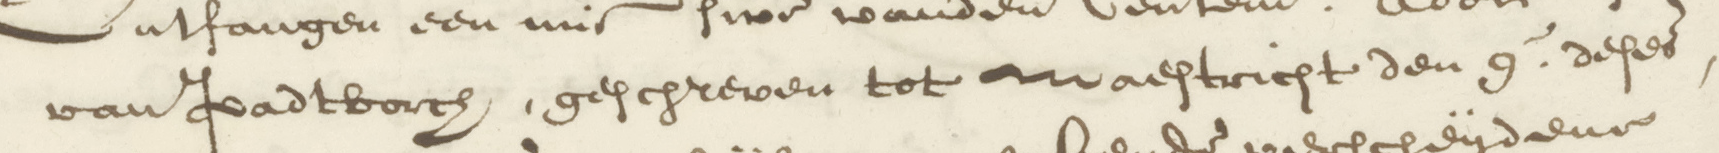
van Padtborch, geschreven tot Maestricht den 9e. deses,
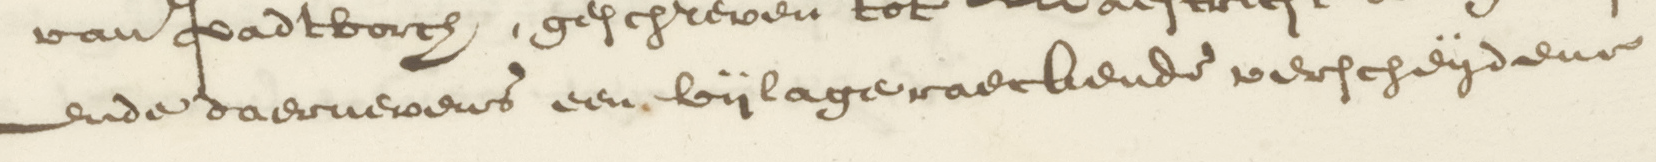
ende daernevens een bijlage raeckende verscheijdene
